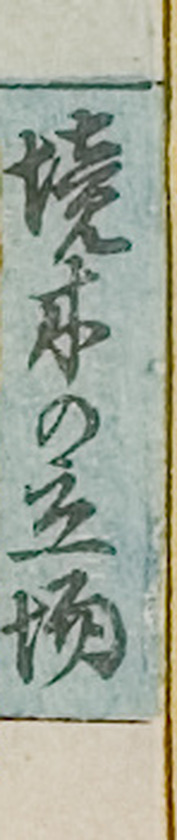境木の立場
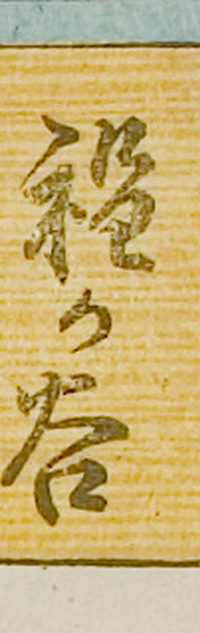程が谷
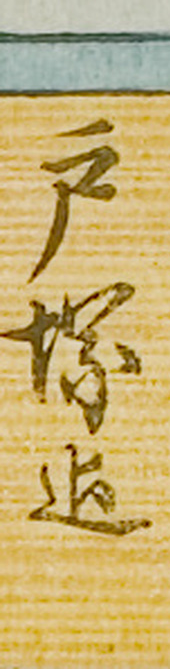戸塚迄
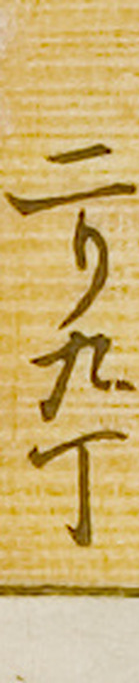二り九丁
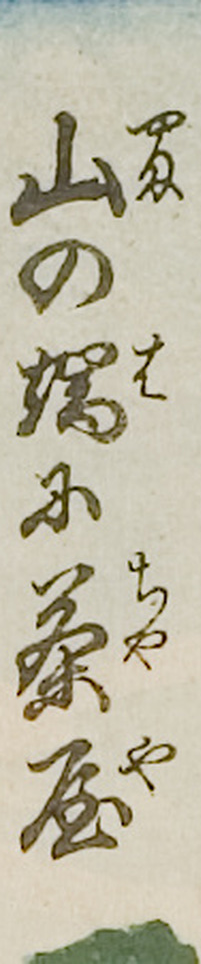山の端に茶屋
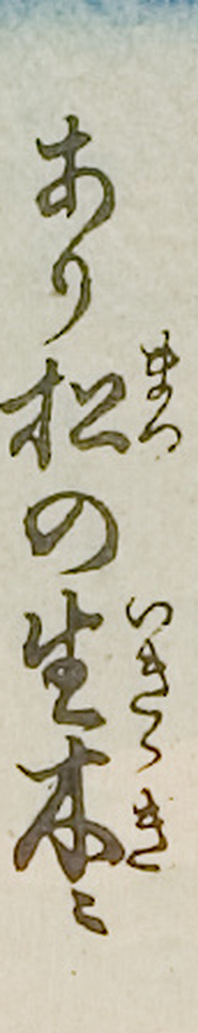あり松の生木ニ
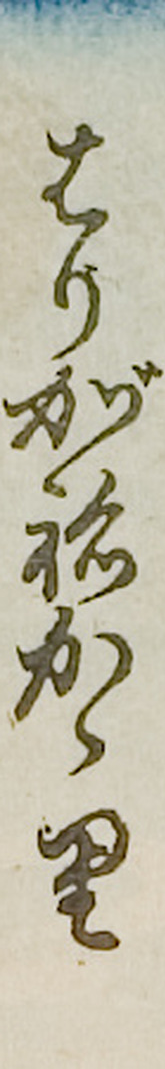はりがねかゝり
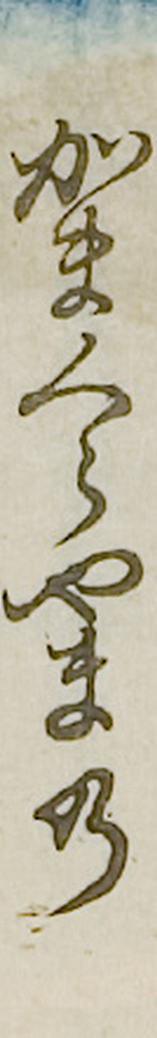かまくらやまの
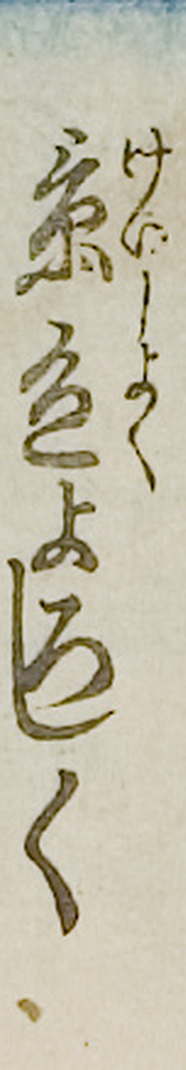景色よろしく
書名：東海名所改正道中記 六 程ヶ谷
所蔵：東京大学総合図書館 General Library in the University of Tokyo, JAPAN
